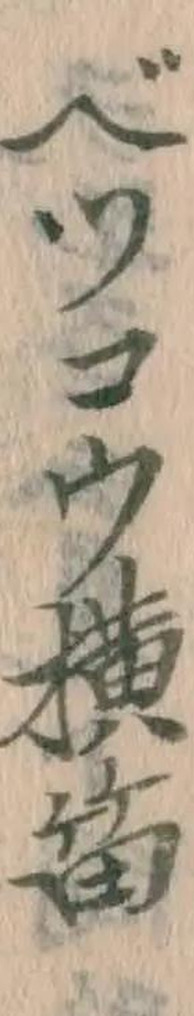ベツコウ横笛
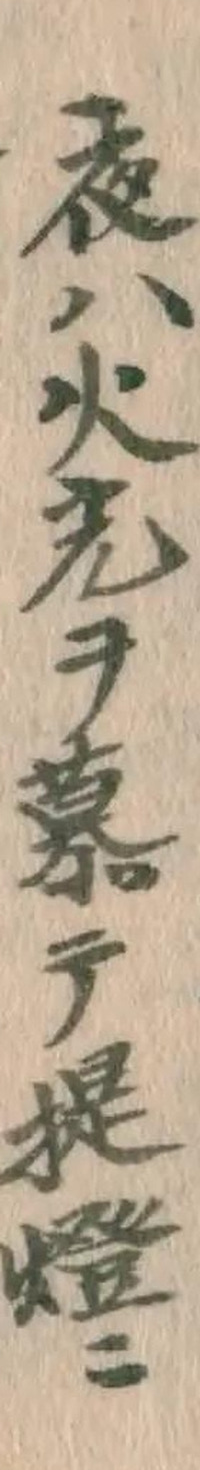夜ハ火光ヲ慕テ提燈ニ
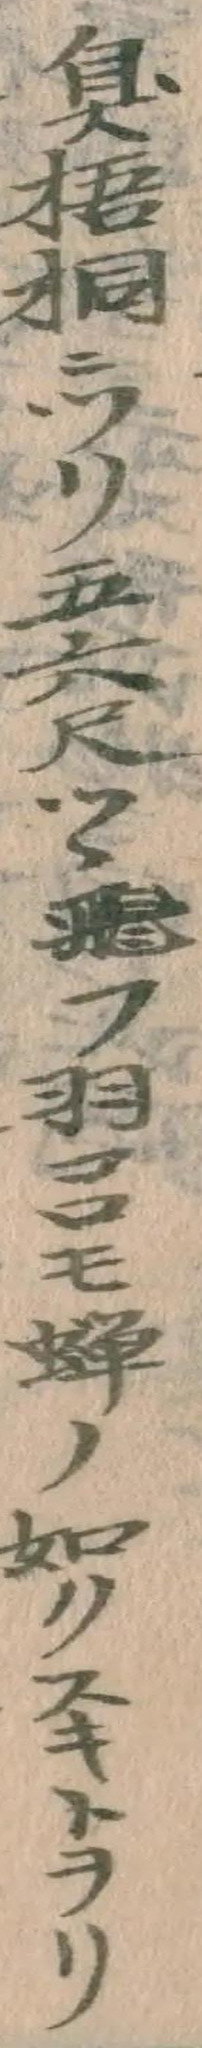臭梧桐ニツク五六尺ツヽ飛フ羽コロモ蝉ノ如クスキトヲリ
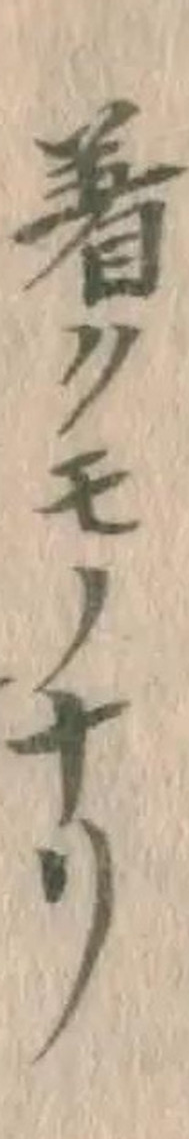着ツクモノナリ
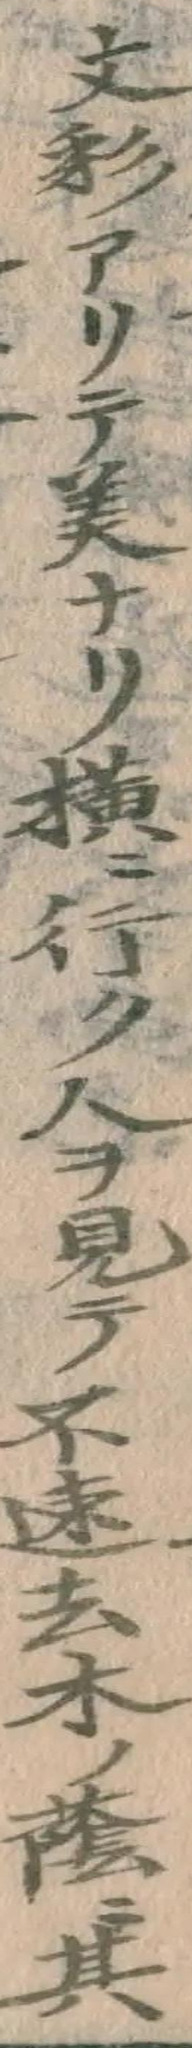文彩アリテ美ナリ横ニ行ク人ヲ見テ不速去木ノ蔭ニ其
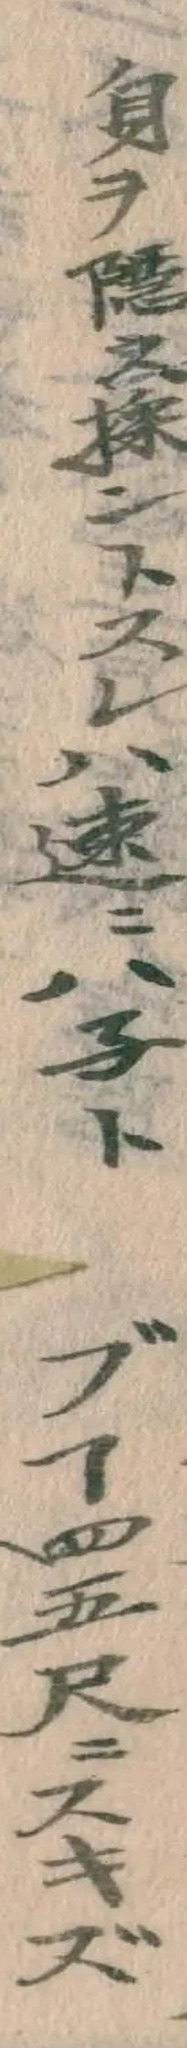身ヲ隠ス採ントスレハ速ニハネトブコト四五尺ニスキズ
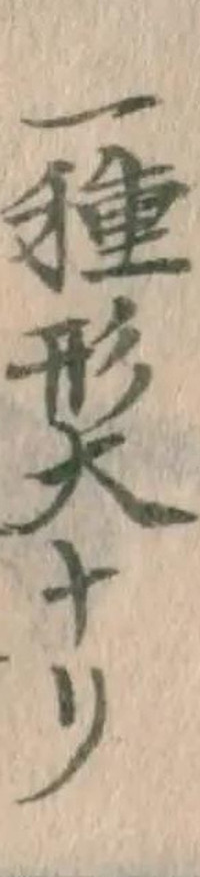一種形大ナリ
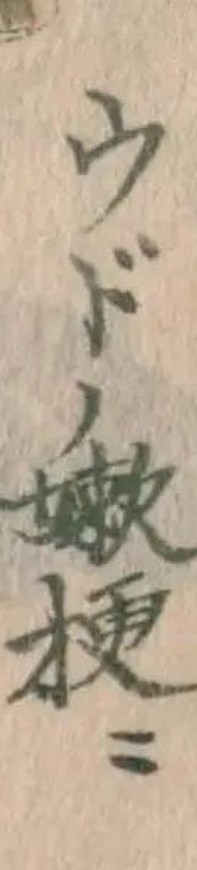ウドノ嫩梗ニ
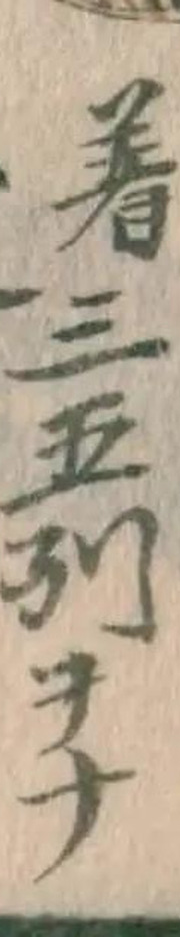着三五列ヲナ
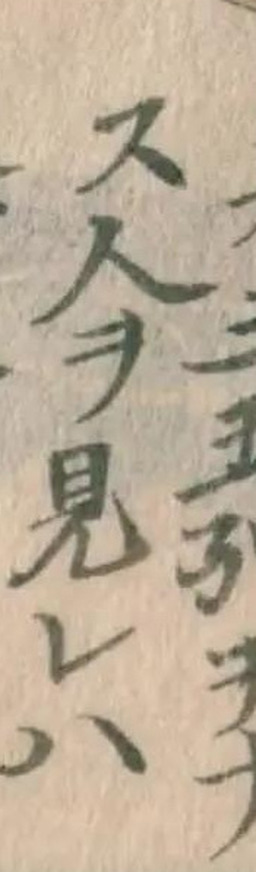ス人ヲ見レハ
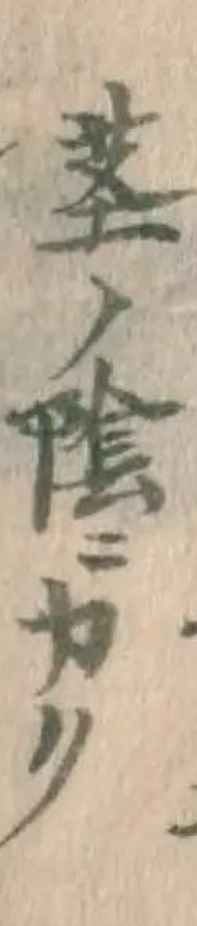茎ノ陰ニカク
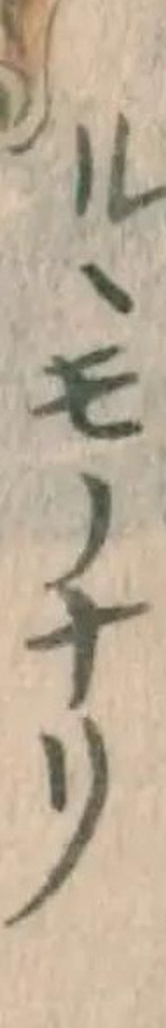ルヽモノナリ

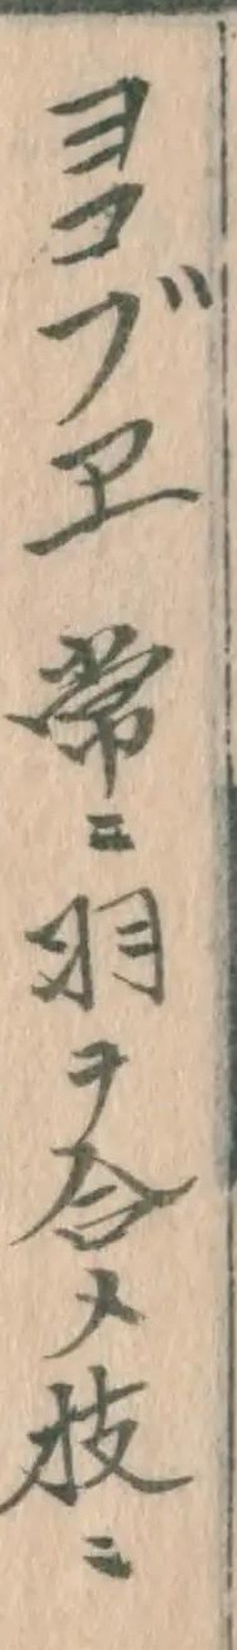ヨコブヱ常ニ羽ヲ合シテ枝ニ
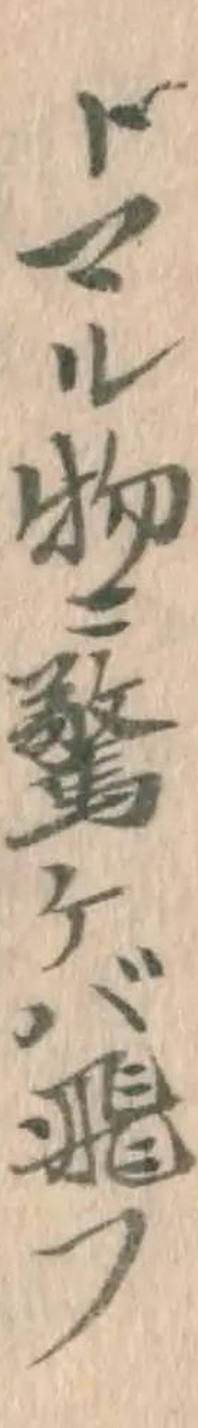トマル物ニ驚ケバ飛フ
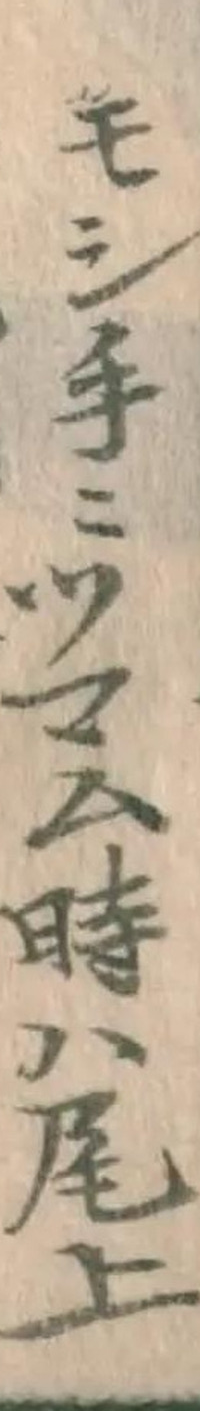モシ手ニツマム時ハ尾上
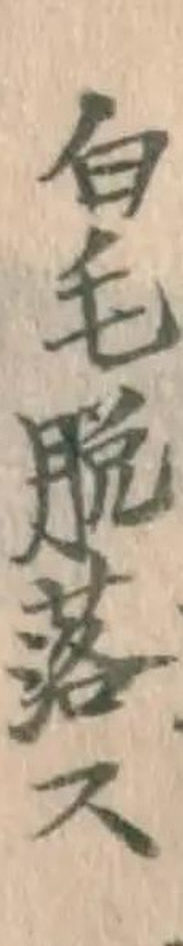白毛脱落ス
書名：千蟲譜 3巻. [3]
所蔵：国立国会図書館 National Diet Library, JAPAN
